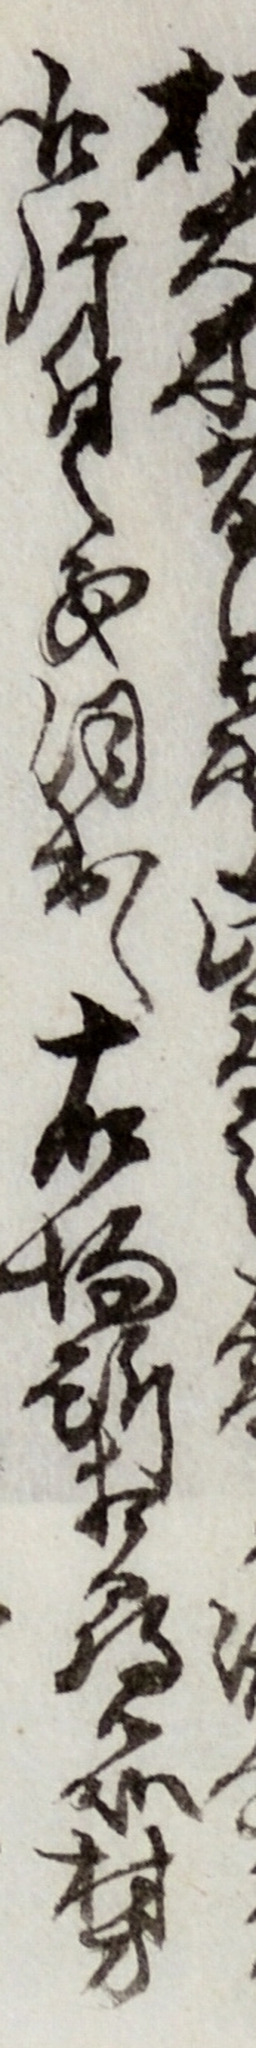被片付候義伺出候右場所相尋候処村方
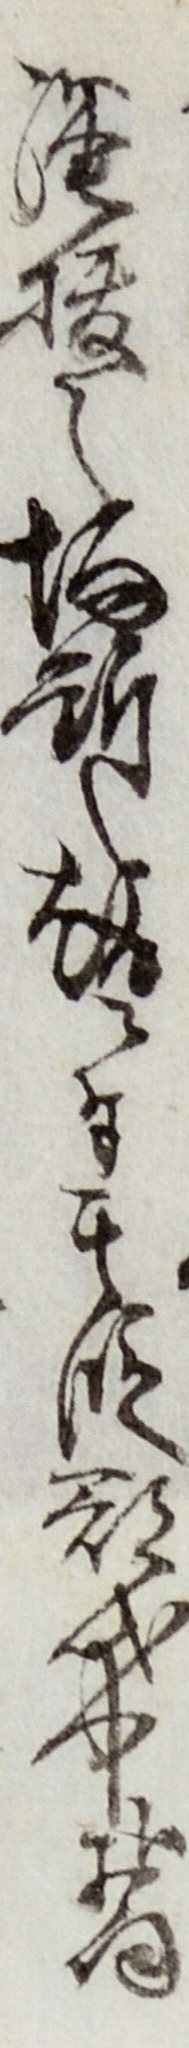縄抜之場所之趣ニ付其段郡代中江相伺
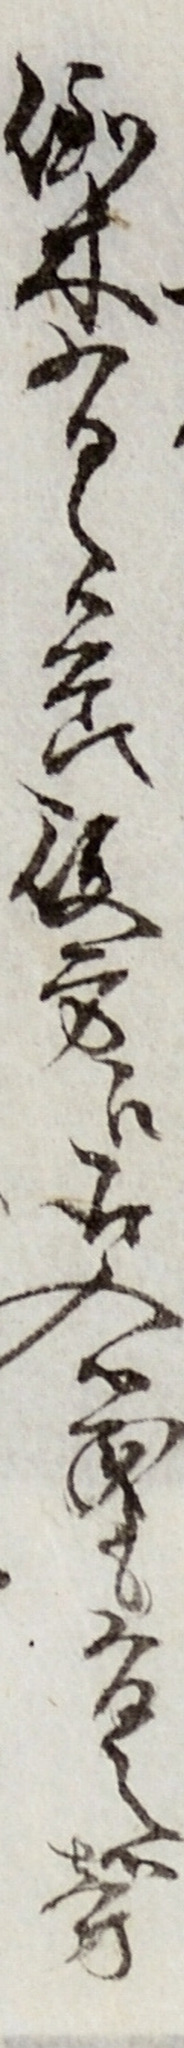倒木有之候節役方江取入候義も有之候旁
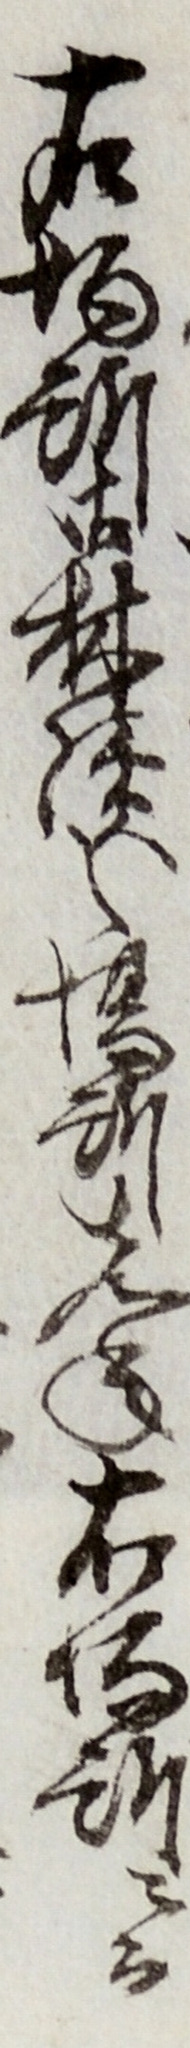右場所御林続之場所先年右場所ニ而
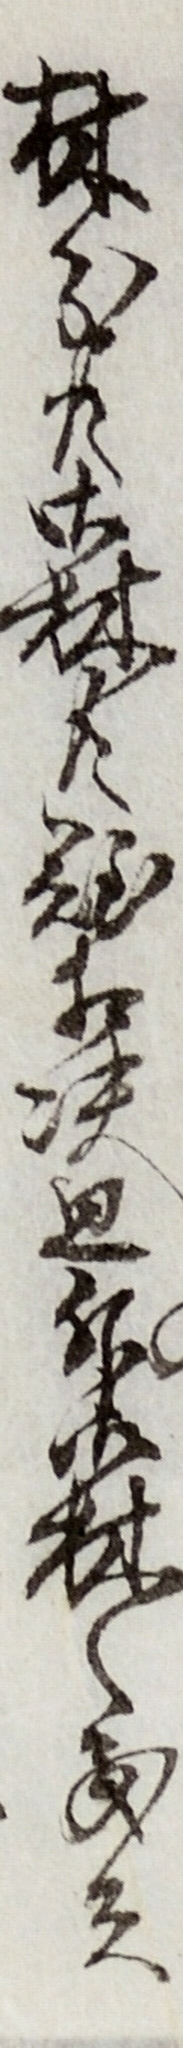林分共御林共難相決且外御林之義者
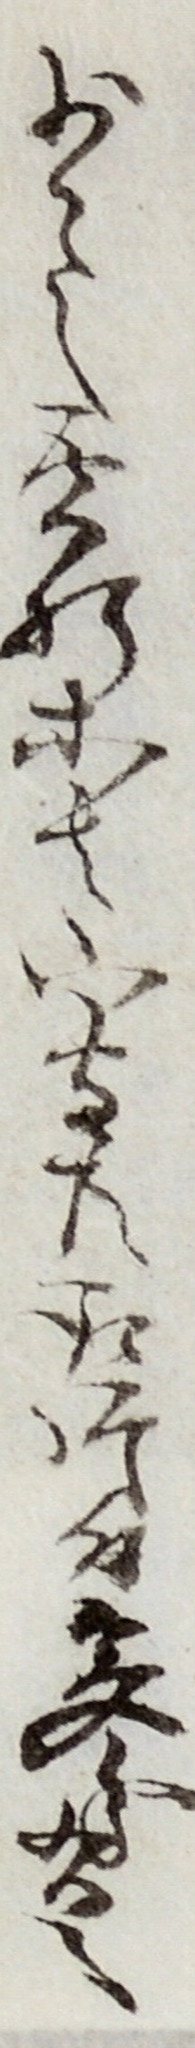少々之雪折等者山守共取片付多分有之
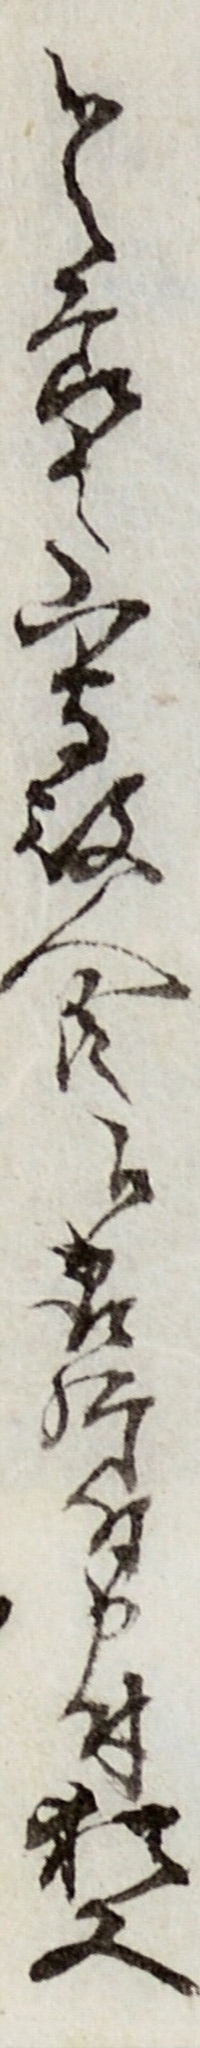候之節者山守役人共江取片付申付猶又
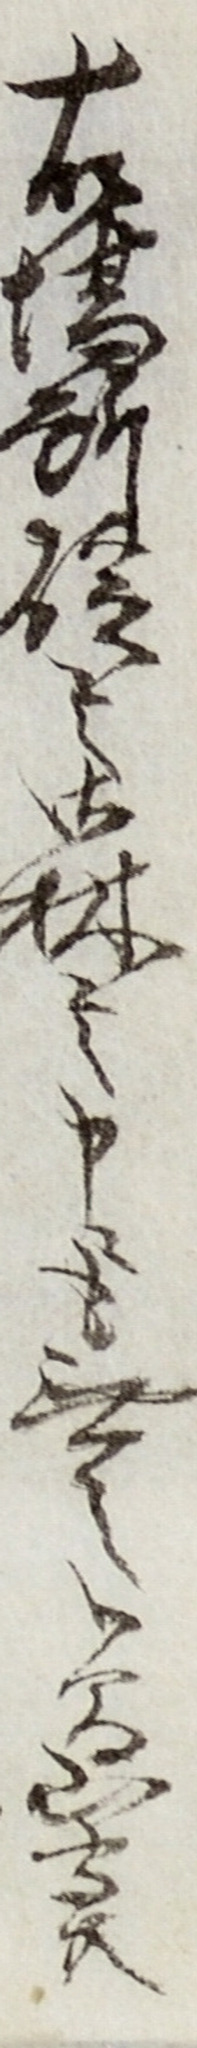右場所聢与御林与申ニも無之候間山守共
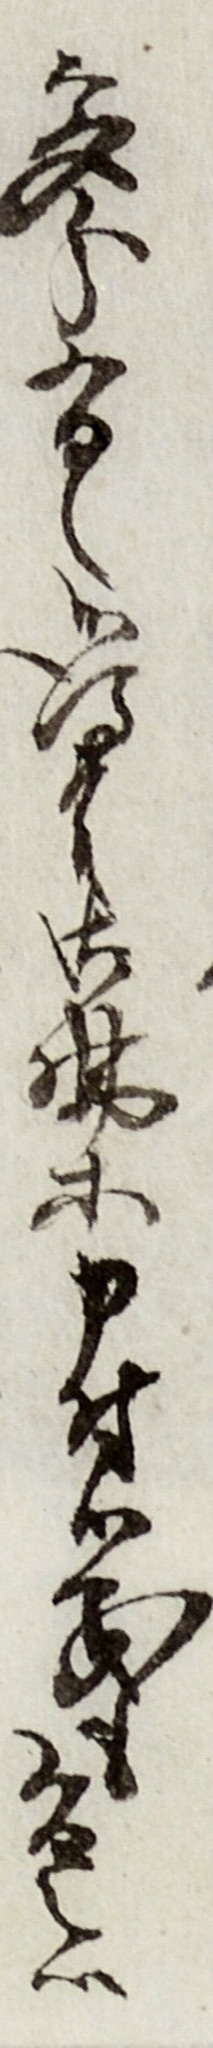多分有之候得者御払等申付候義も有之候
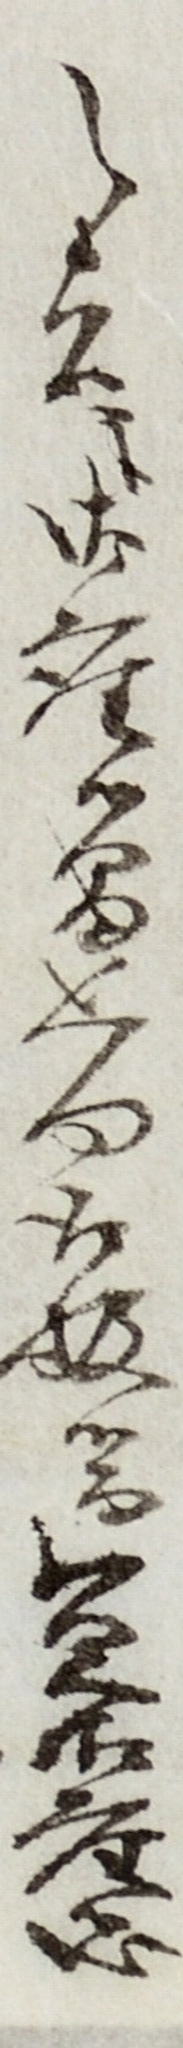之者ニ御座候間如何取扱候而宜御座候哉
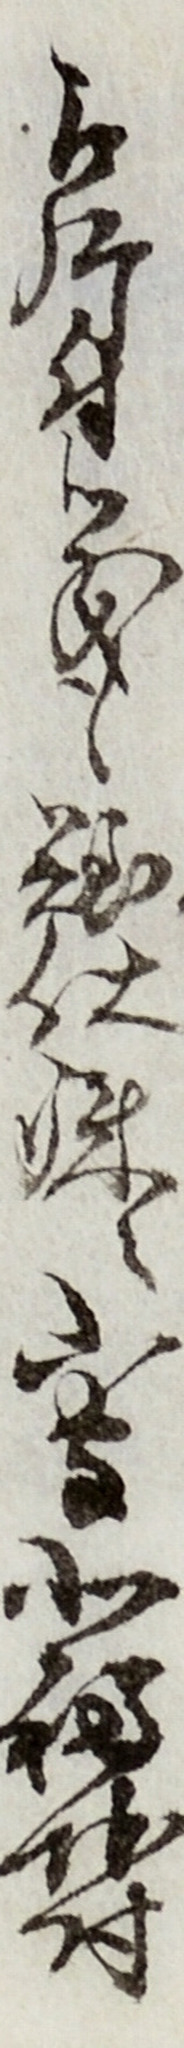取付候義も難仕殊ニ山守北福地村
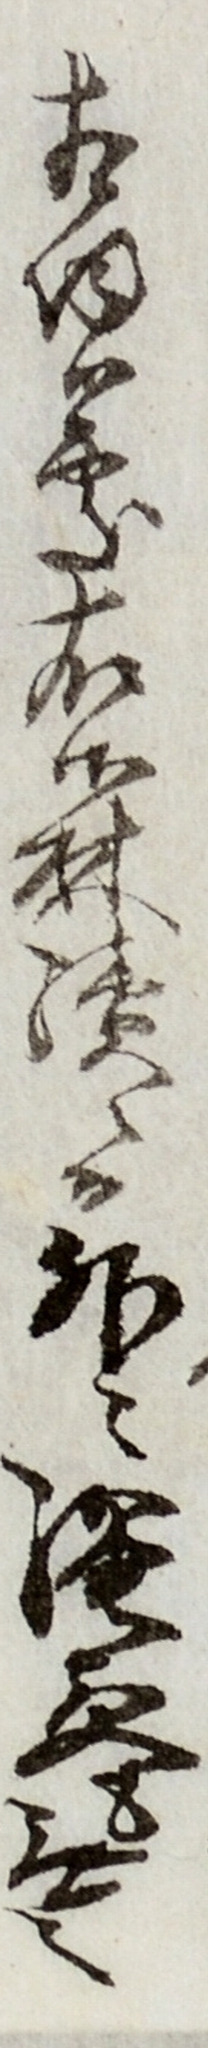相伺候処右御林続ニ而外ニ縄受も無之
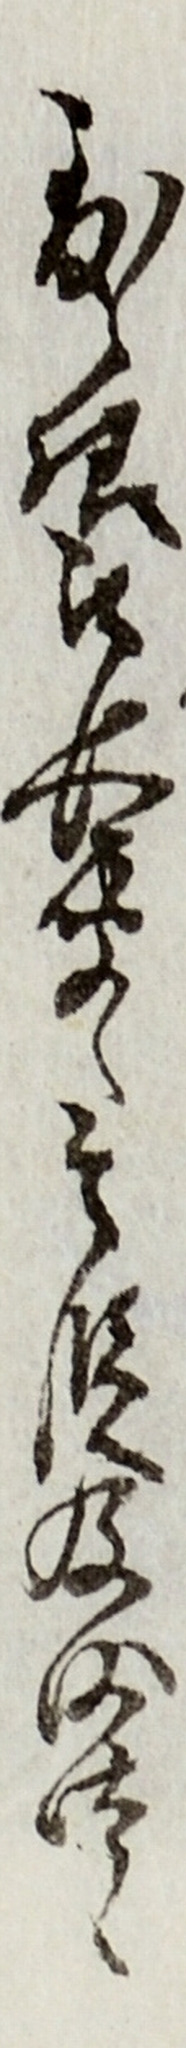致候様被仰聞候其段及沙汰候
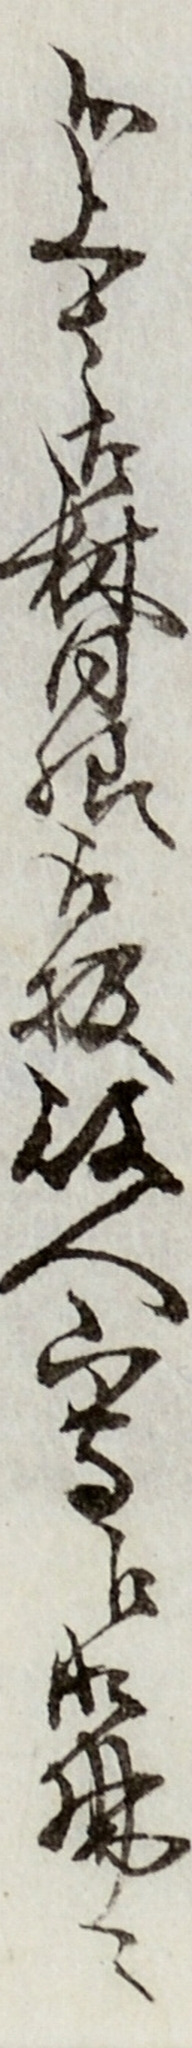候上者御林同様取扱役人山守江御払ニ
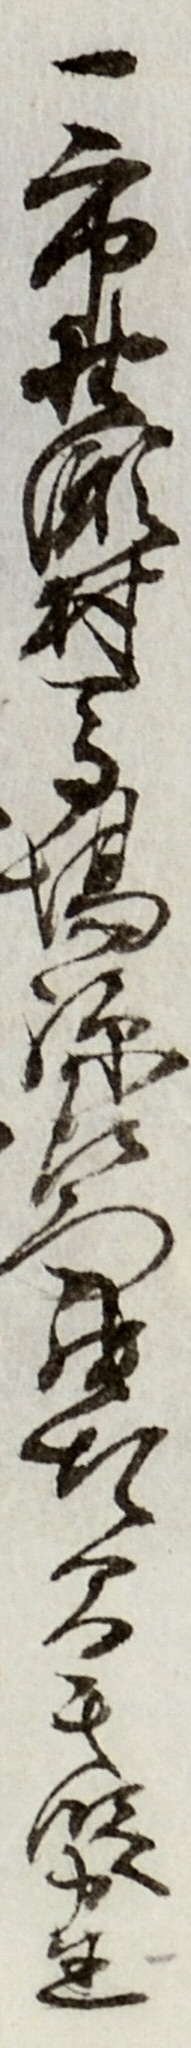一市野瀬村馬場源左衛門罷出候間其段申達
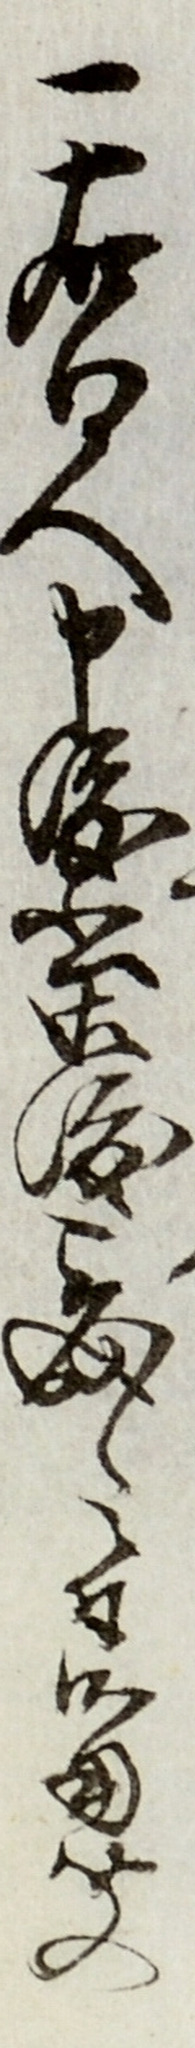一右同人申渡書御渡被成候ニ付御用聞
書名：御山方御薪方諸事御用留
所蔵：伊那市立高遠町図書館・合同会社AMANE
